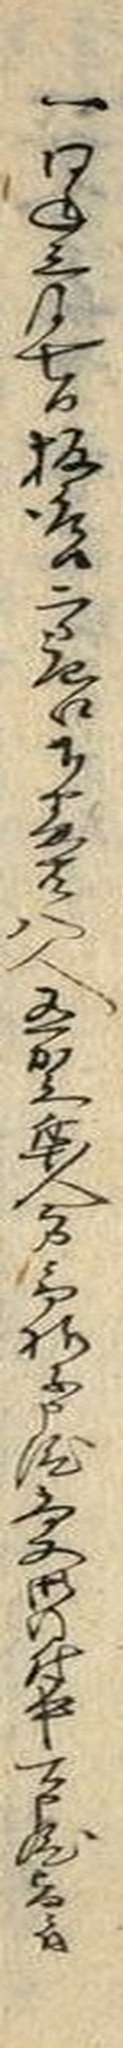一同年三月七日板取口二ツ屋口下番共八人有賀隼人方ニ而様子申渡尚又御目付中可申渡旨ニ付
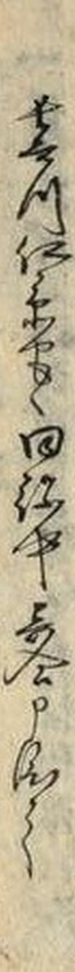長谷川仁兵衛宅へ同役中寄合申渡之
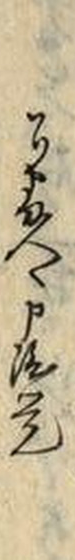下番人へ申渡覚

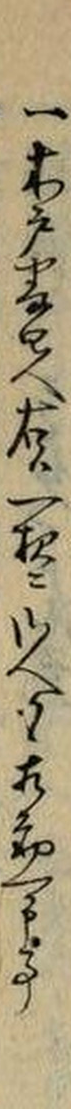一木戸番四人右ハ一夜ニ弐人ツヽ相勤可申事
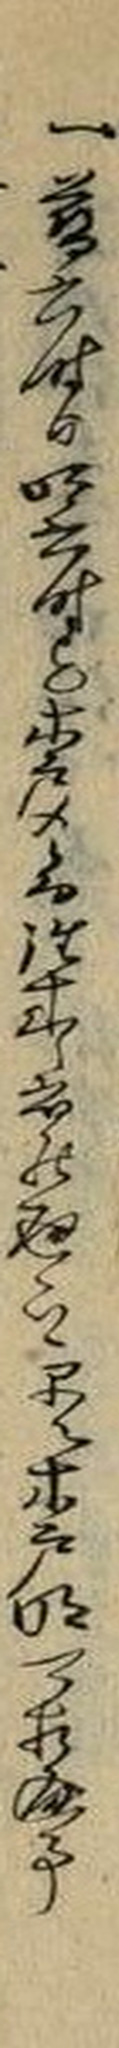一暮六時ゟ明六時迄木戸〆候而往来之者罷通候ハヽ早々木戸明可相通事
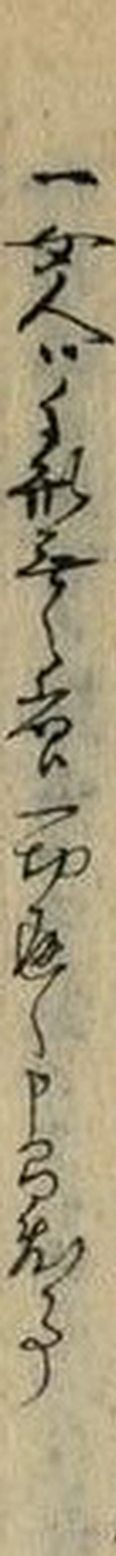一女人ハ手形無之者ハ一切通し申間敷事
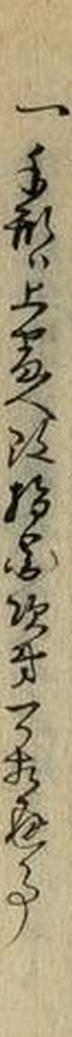一手形ハ上番人改指図次第可相通事
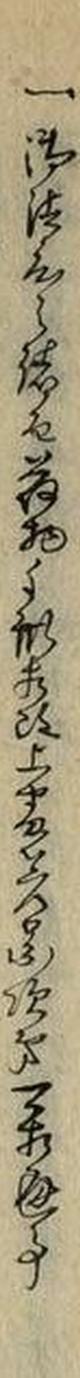一御御法度之諸色荷物手形相改上番差図次第可相通事
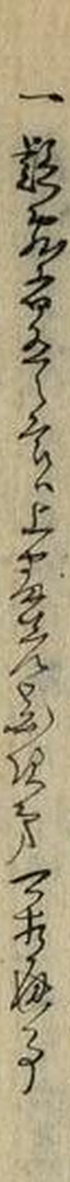一難敷者有之節ハ上番差図次第可相通事
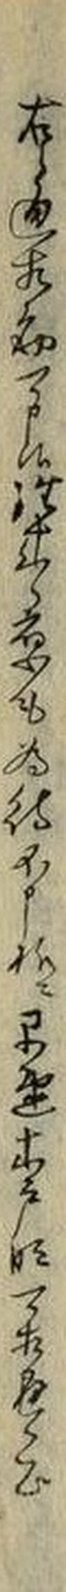右之通相勤可申候往来之者少も為待不申様ニ早速木戸明可相通候以上
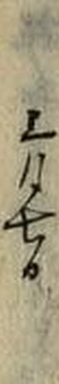三月七日
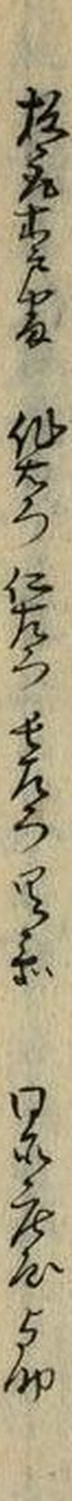板取木戸番作右衛門仁左衛門長左衛門四郎兵衛同所庄屋与助
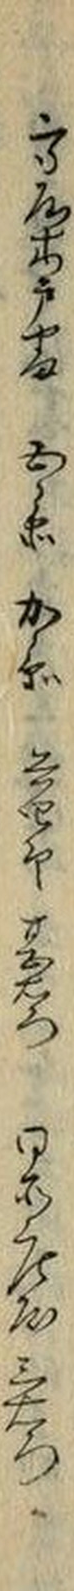二ツ屋木戸番五兵衛加兵衛兵四郎甚右衛門同所庄屋三右衛門
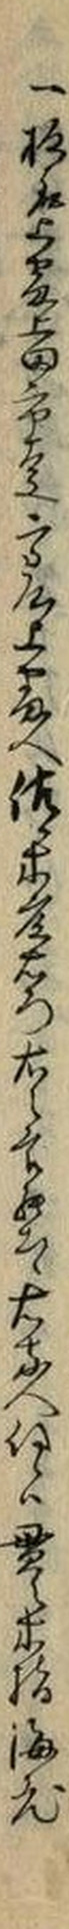一板取上番上田市太夫二ツ屋上番人佐々木藤右衛門右之節罷出候右両人伺候ハ貫之木指海老
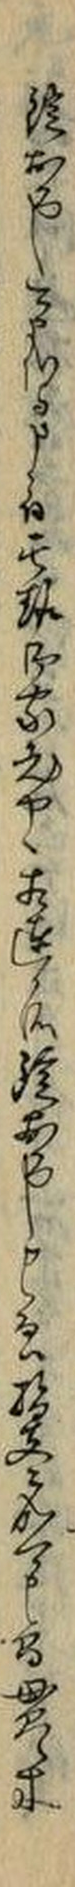錠おろし可申哉与申候ニ付其趣御家老中へ相達候所錠おろし申候而ハ指支と成可申候間貫之木
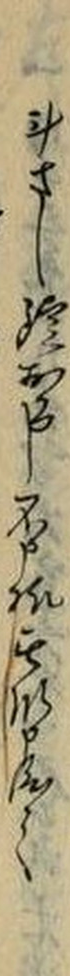斗さし錠おろし不申様其段申渡之
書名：御国他国諸事之部
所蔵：福井県文書館 Fukui Prefectural Archives
